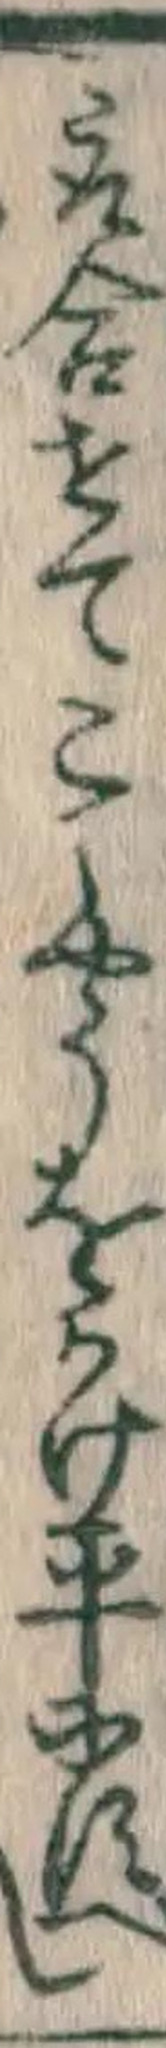取合せてこしやうをかけ平にすべし
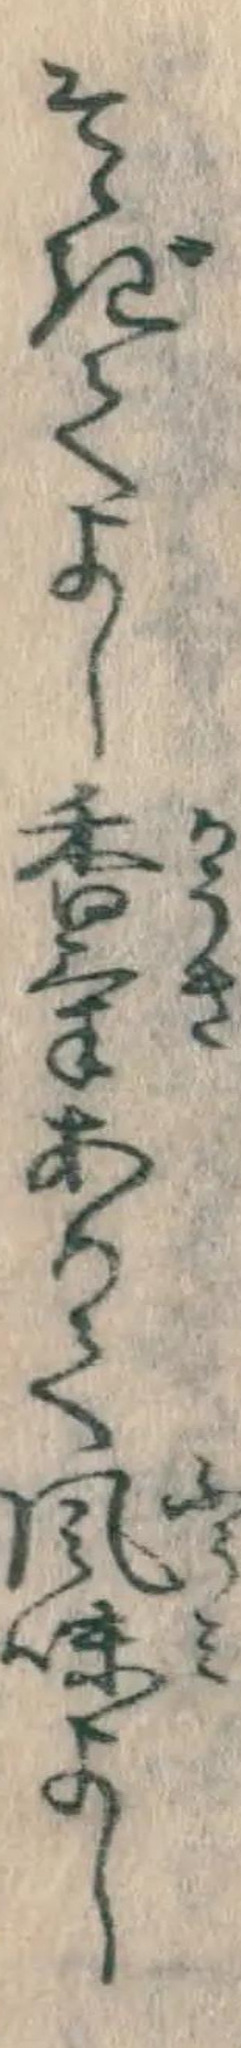そゝぎてよし香気ありて風味よし
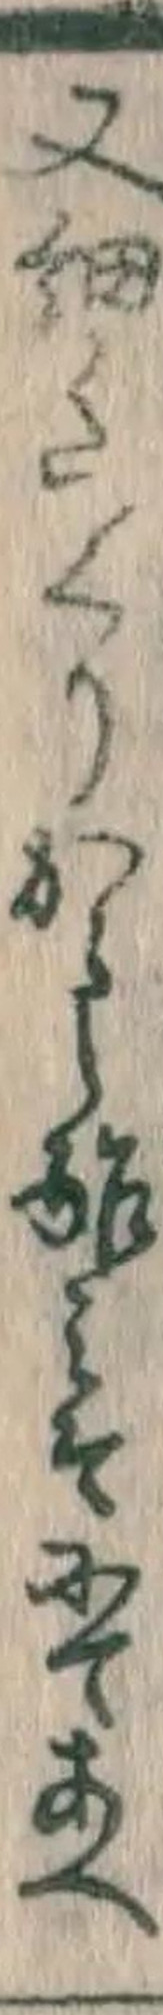又細くつくりからし酢みそにてあへ
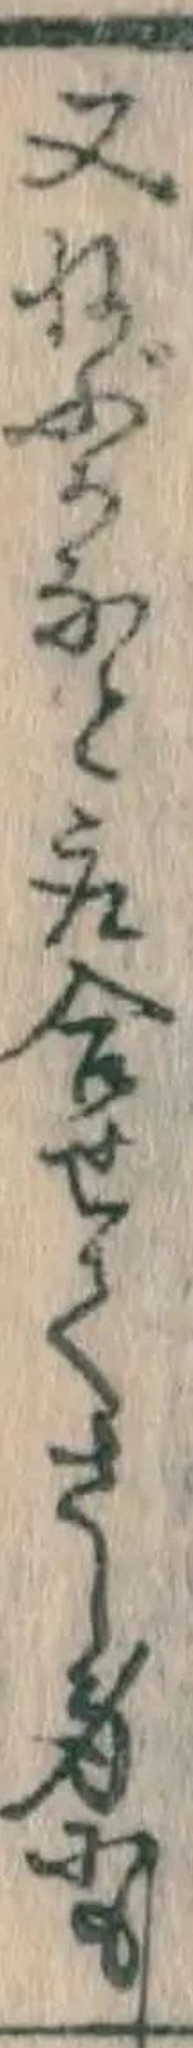又ねぶかなと取合せてさし身にも
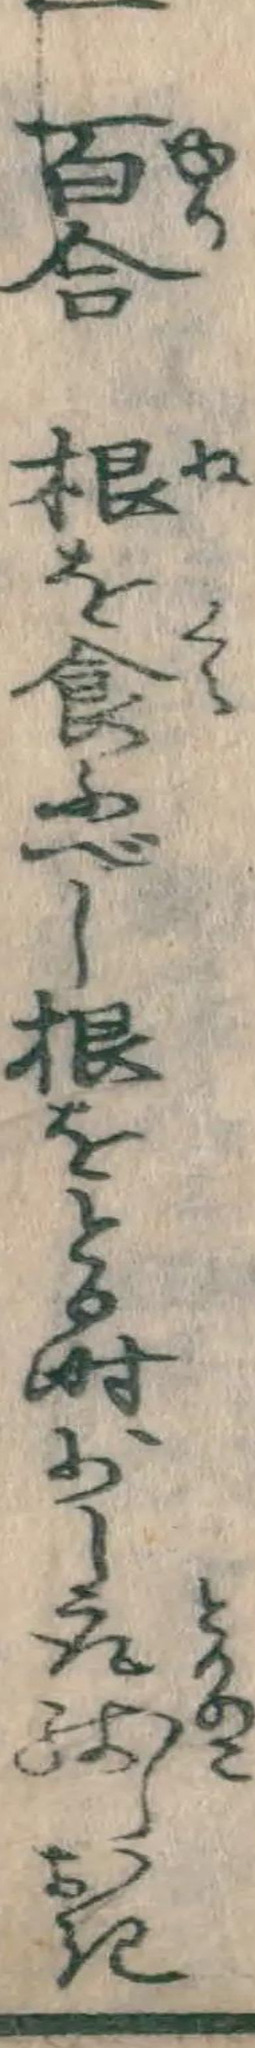一百合根を食ふべし根をとる時少し取残しおき
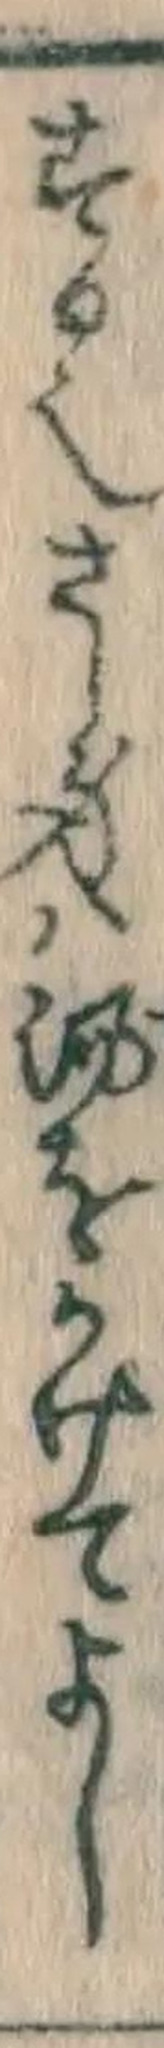する也さし身は湯をかけてよし
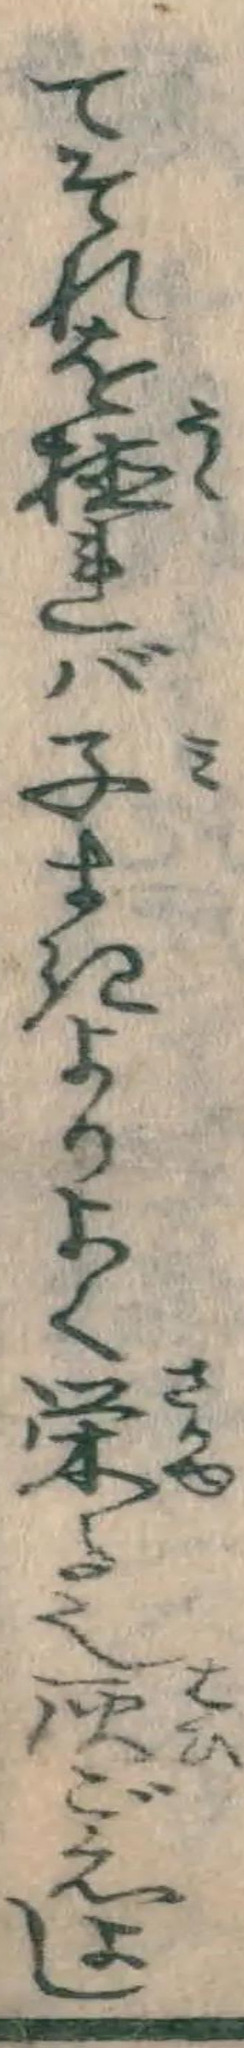てそれを植れば子まきよりよく栄る也灰ごえよし

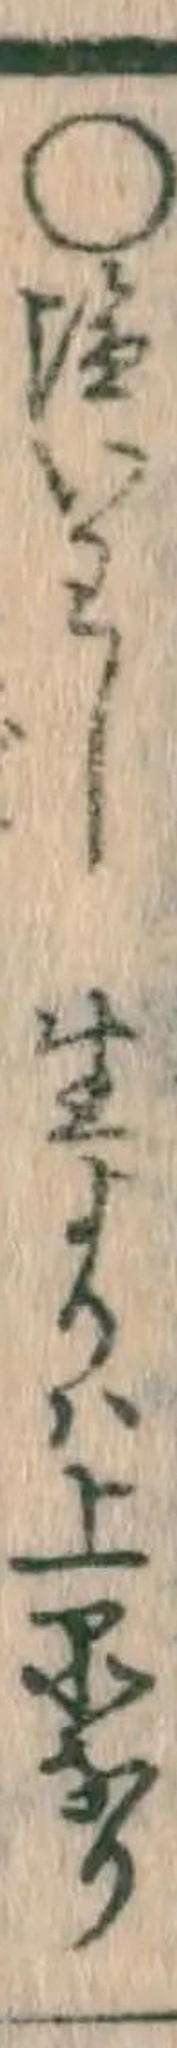○塩いわし生よりは上品なり
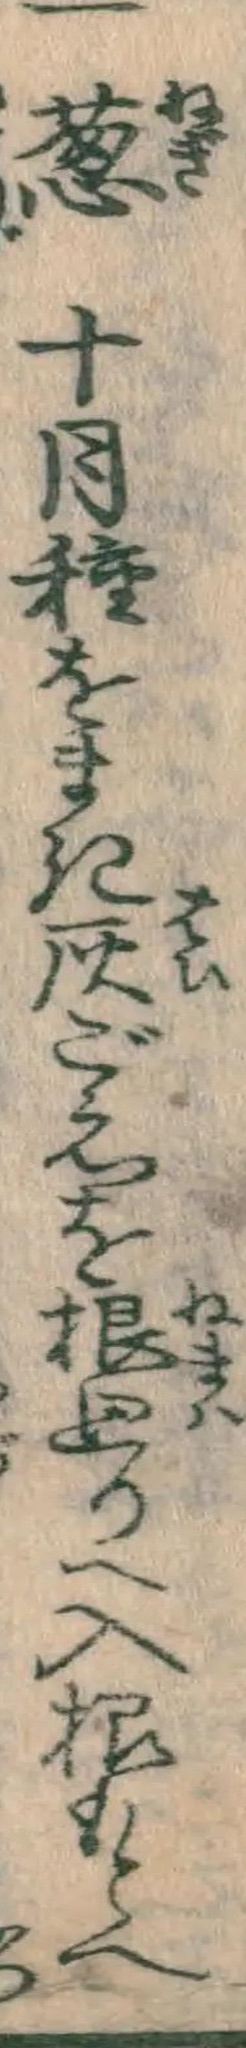一葱十月種をまき灰ごえを根廻りへ入根もとへ
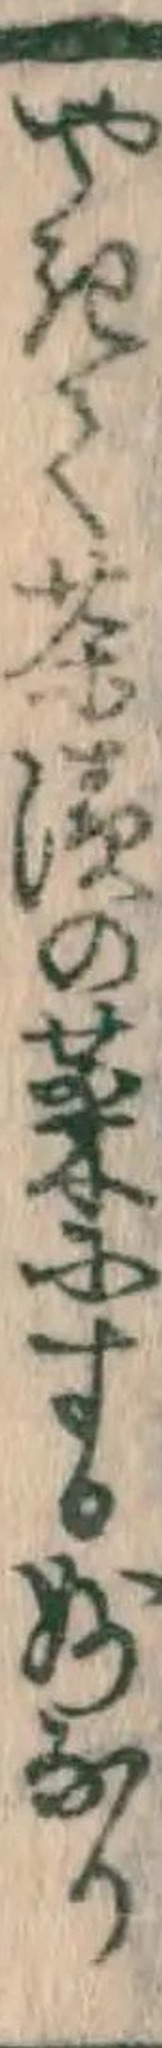やきて茶漬の菜にする妙なり
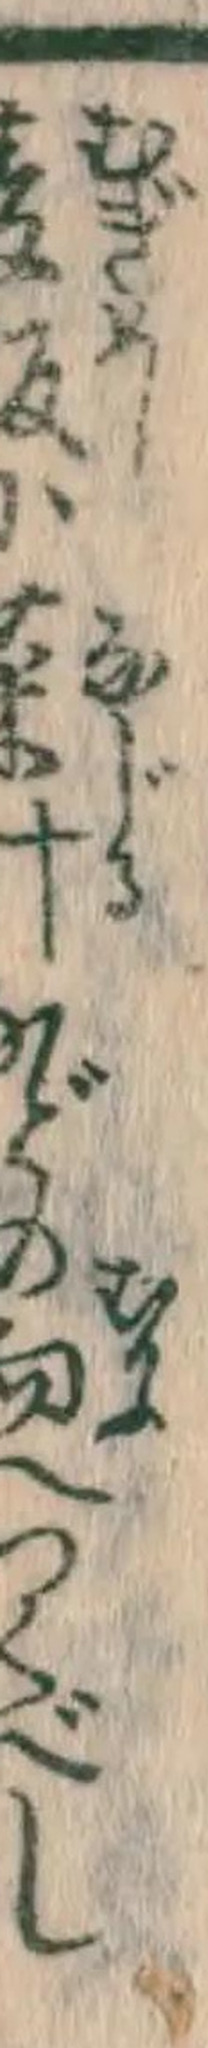麦飯に菜汁などの向へつくべし
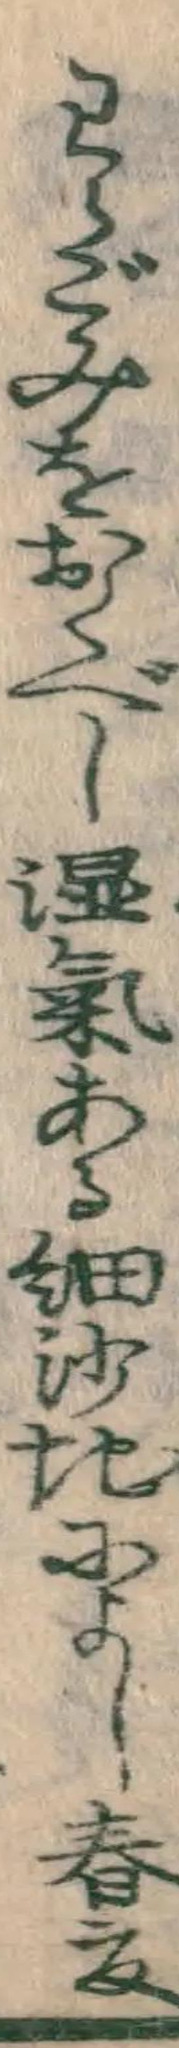わらごみをおくべし湿気ある細沙地によし春夏
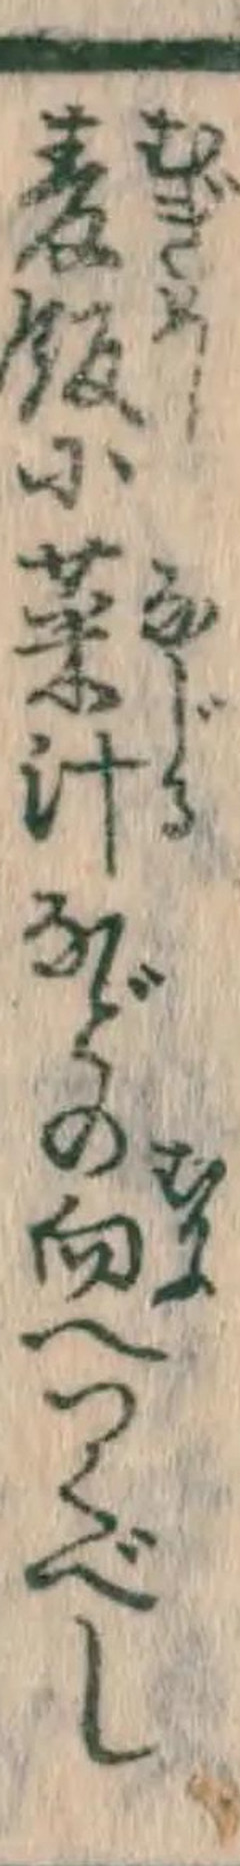麦飯に菜汁などの向へつくべし
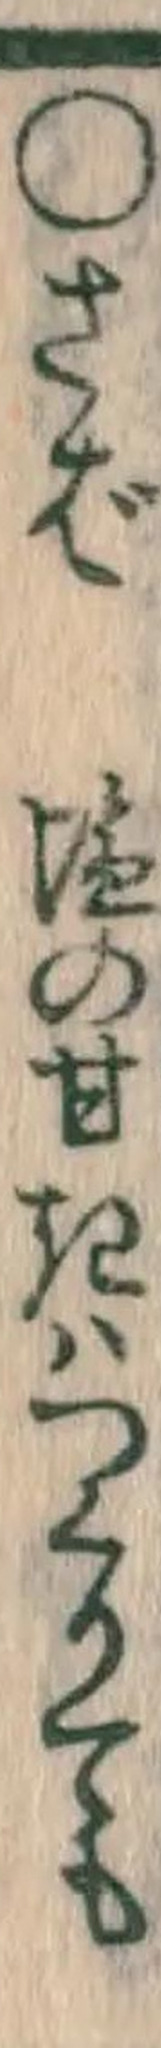○さば塩の甘きはつくりても
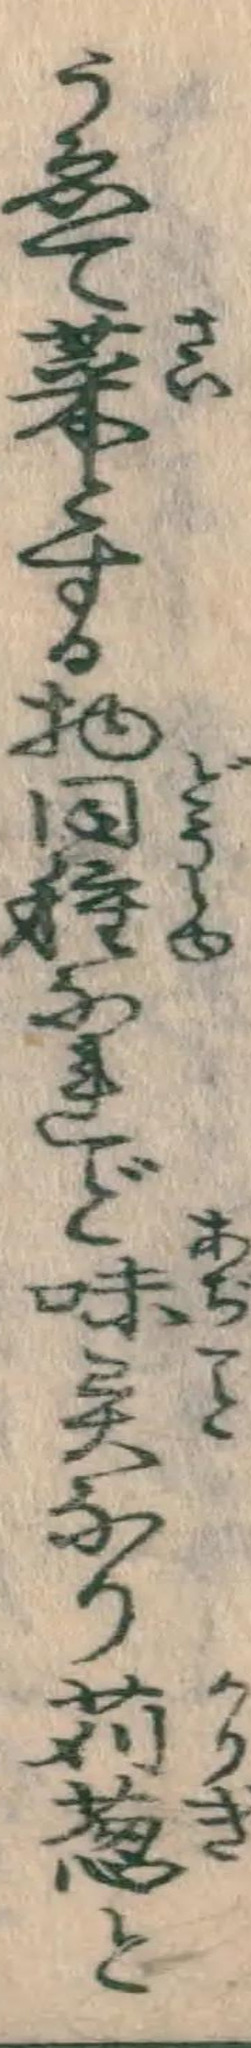うゑて菜とする物同種なれど味異なり苅葱と
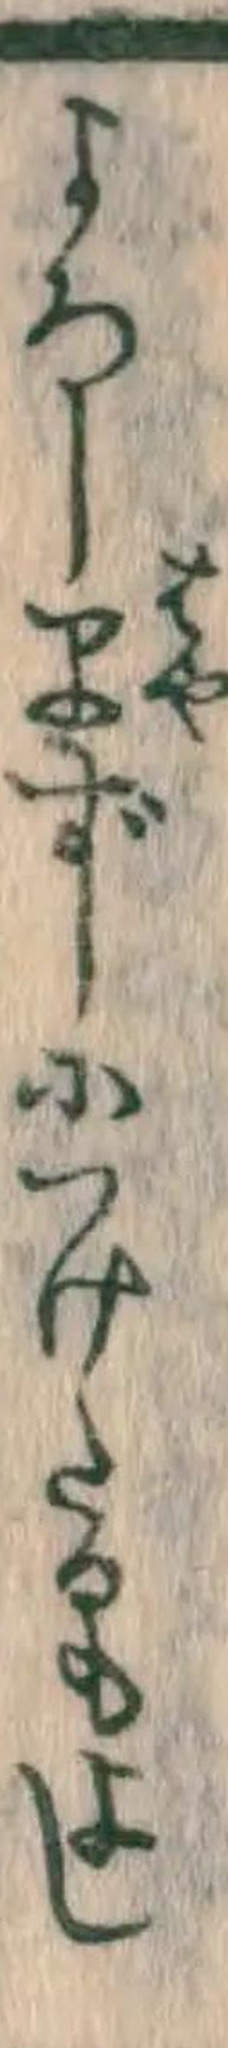よろし早ずしにつけたるもよし
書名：広益秘事大全 3巻. [5]
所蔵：国立国会図書館 National Diet Library, JAPAN
